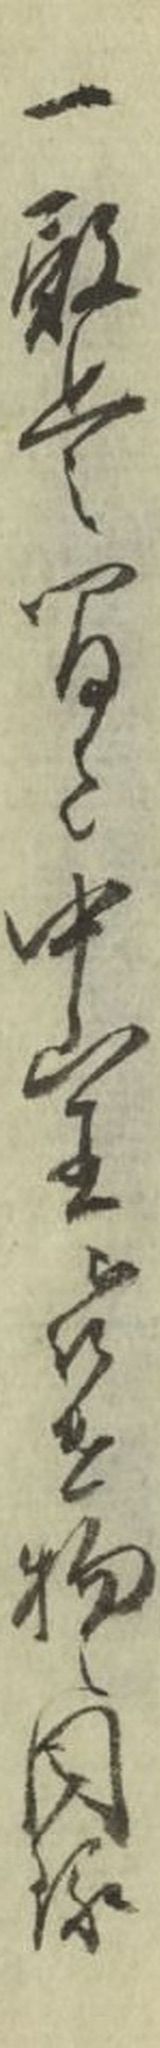一殿上之間中山王え被遣物之目録
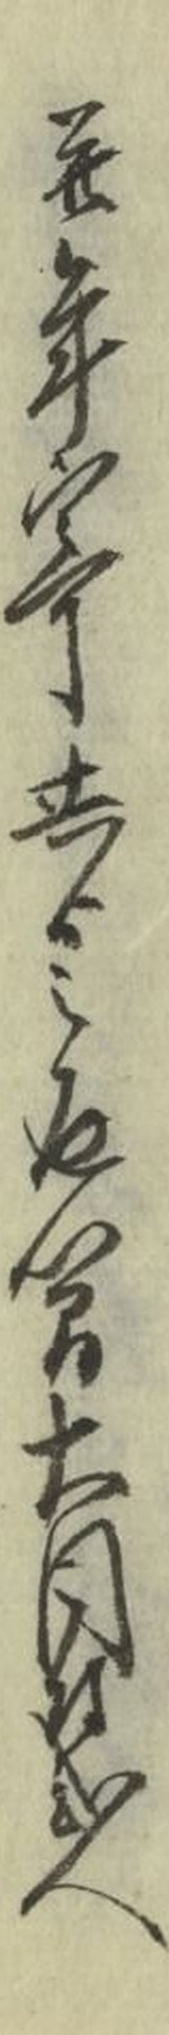幷年寄共ゟ之返簡大目付弐人
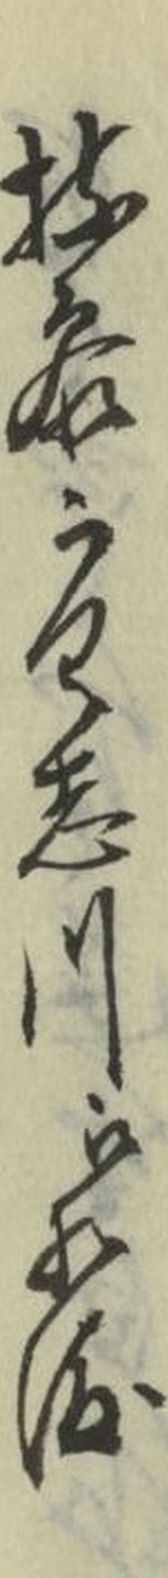持参而具志川え相渡
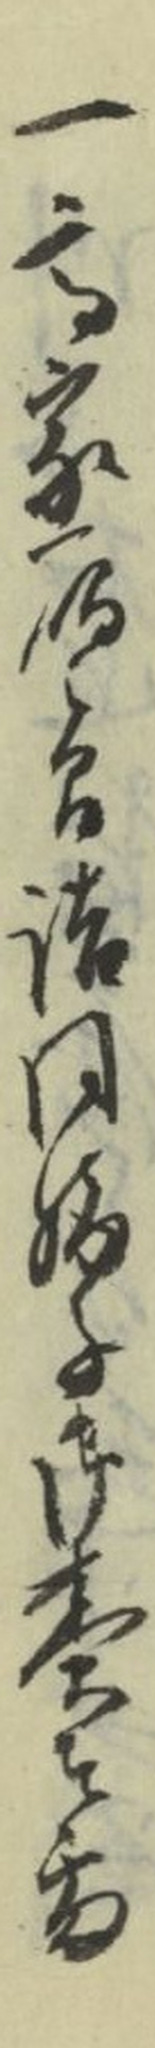一高家雁之間詰同嫡子御奏者番
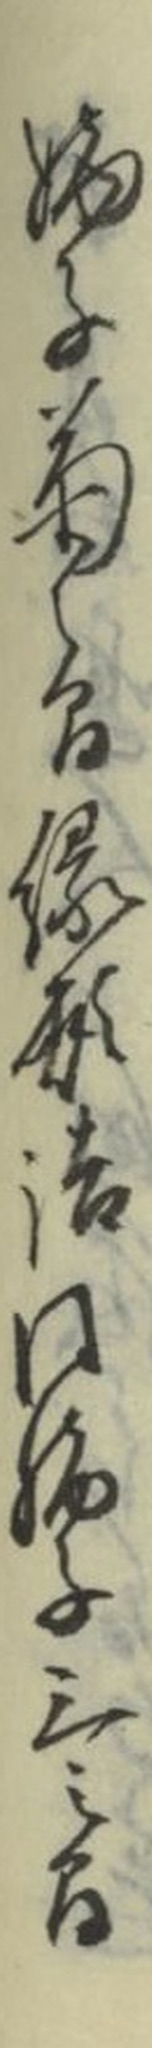嫡子菊之間縁頬詰同嫡子三之間
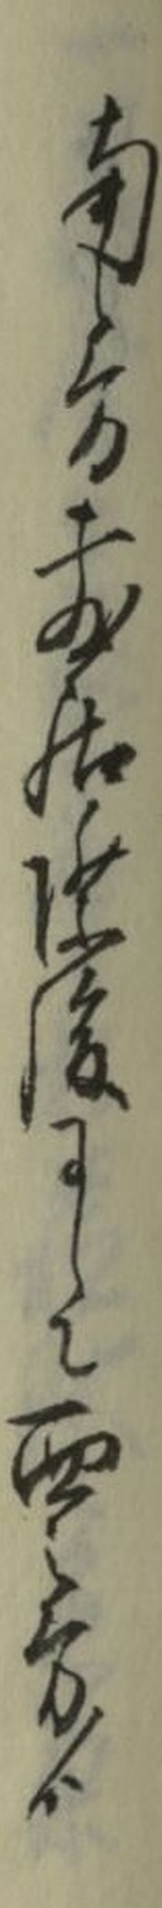南之方敷居際後にして西之方ゟ
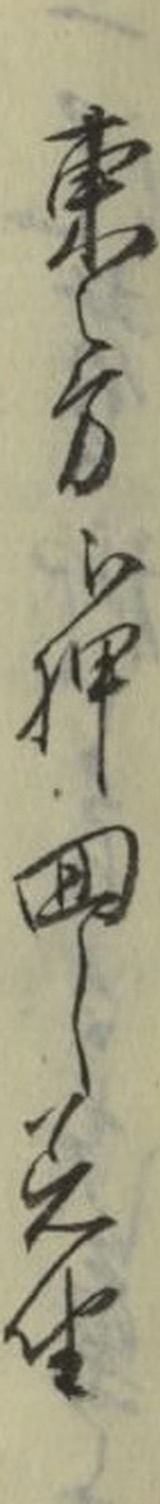東之方え押回し着坐
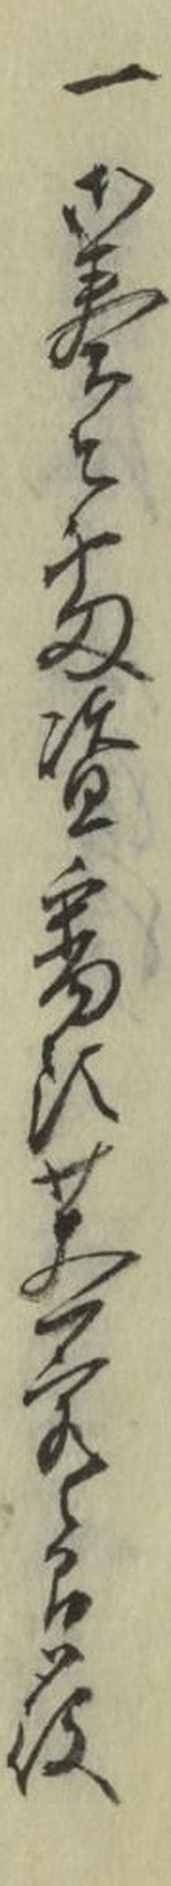一御奏者番頭廻番頭芙蓉之間御役
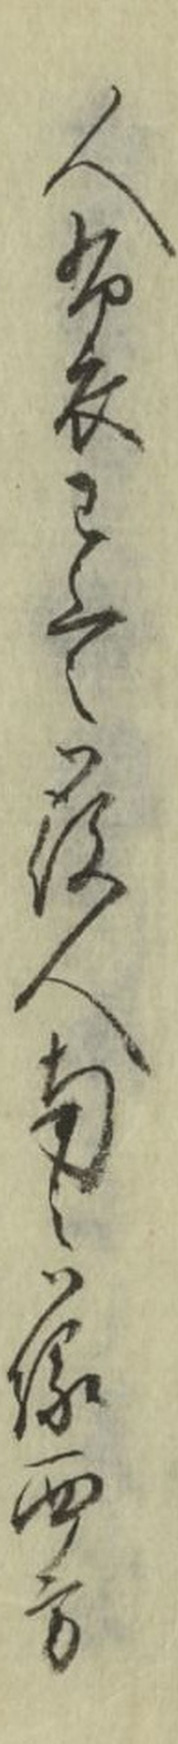人布衣已上之御役人南之御縁西之方
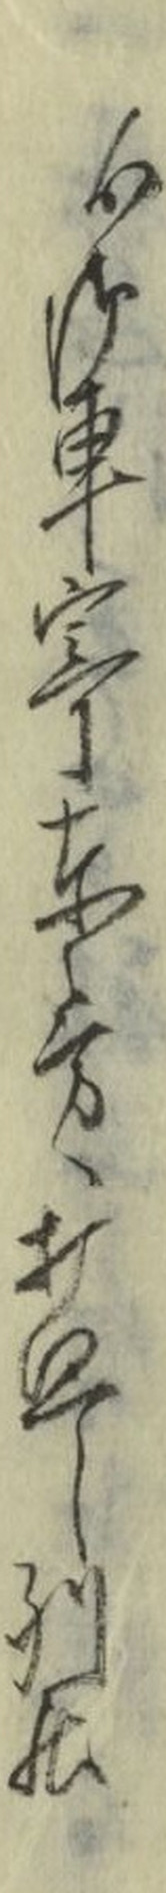ゟ御車寄東之方へ折廻し列居
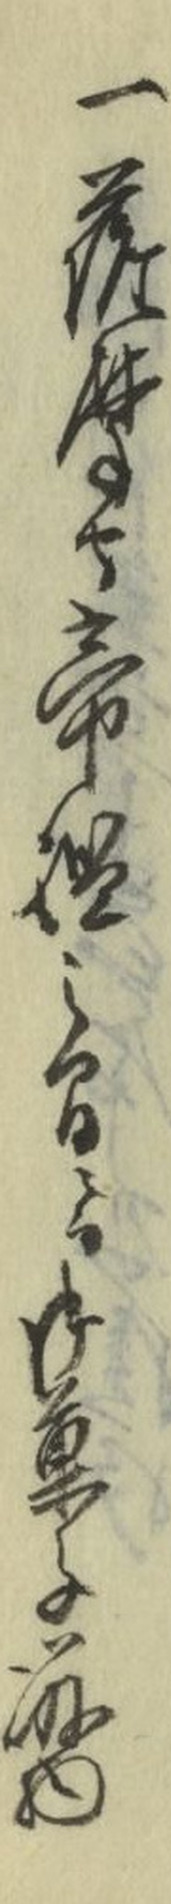一薩摩守帝鑑之間に而御菓子御吸物

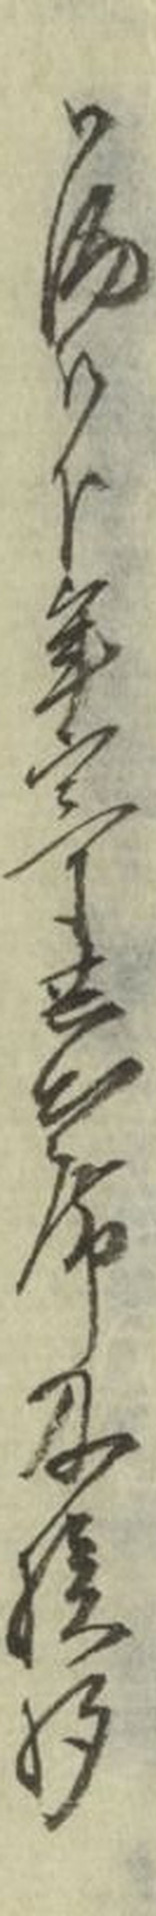御酒被下年寄共出席及挨拶
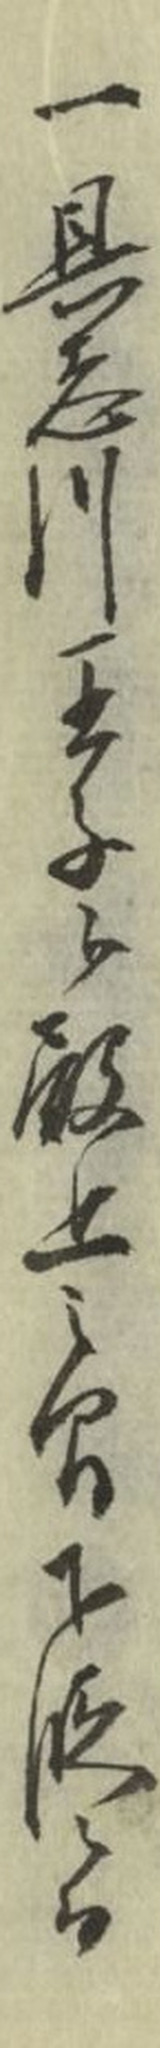一具志川王子え殿上之間下段に而
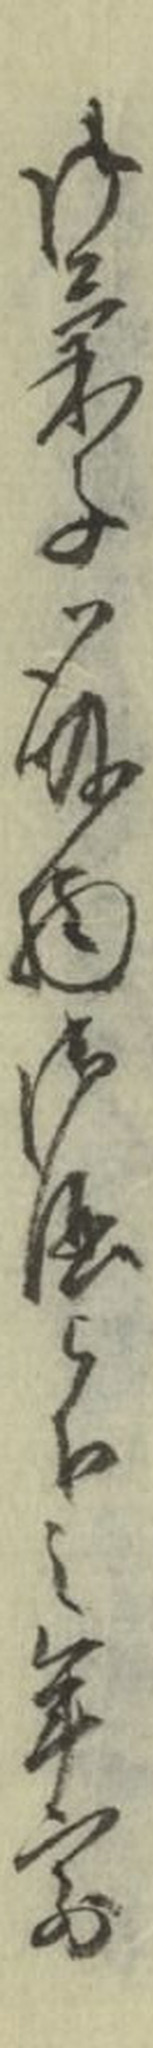御菓子御吸物御酒被下之年寄
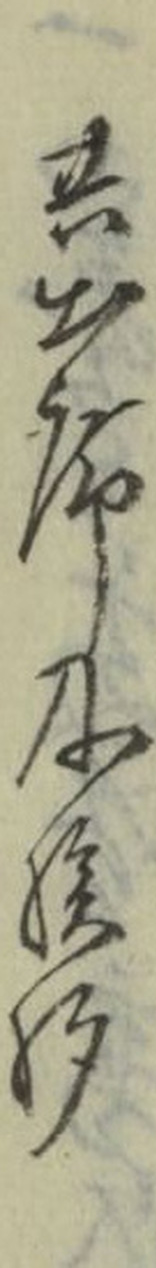共出席及挨拶
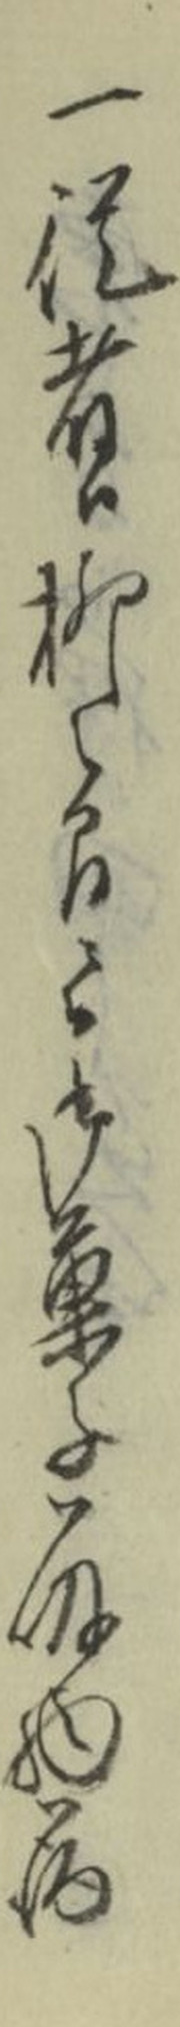一従者え柳之間に而御菓子御吸物御酒
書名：琉球人来朝記 四之五
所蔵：University of the Ryukyus Library
